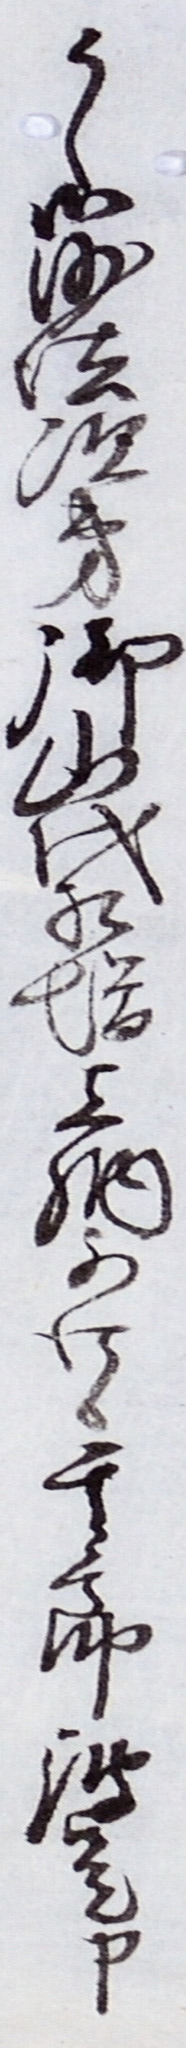うし御沙汰次第御山代相増上納可仕候其節彼是申
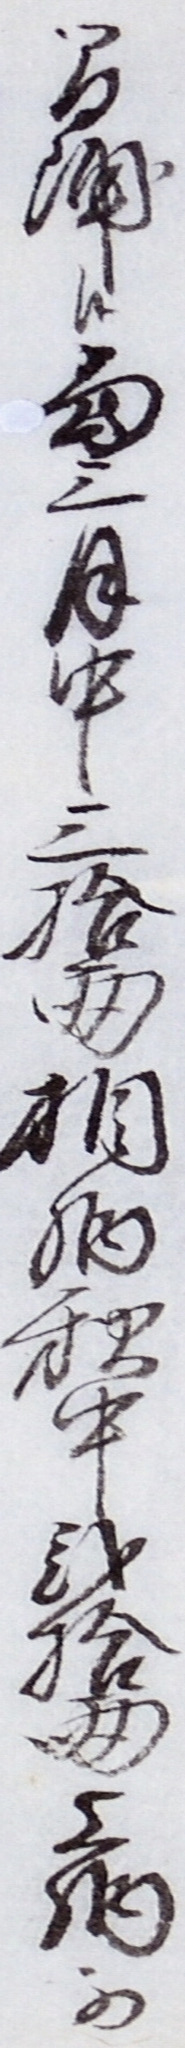間鋪候当三月中三拾両相納秋中弐拾両上納可
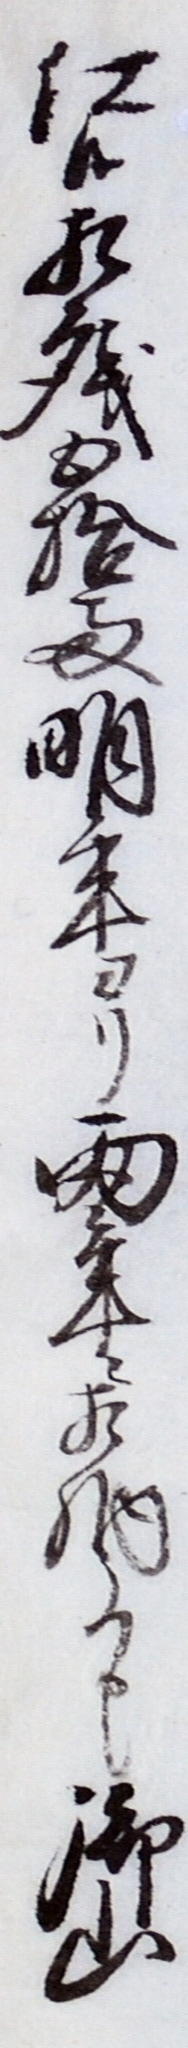仕候相残五拾両明年ヨリ両年ニ相納可申御山
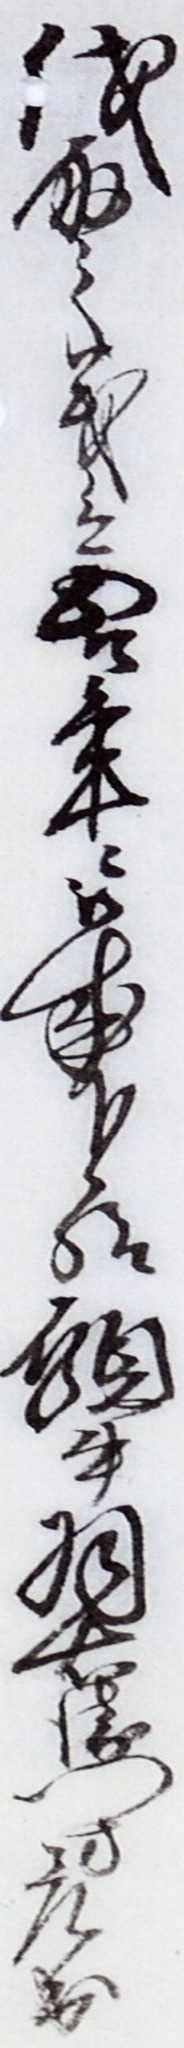伐取之義は五ケ年ニ被成下候様願書羽右衛門方差出
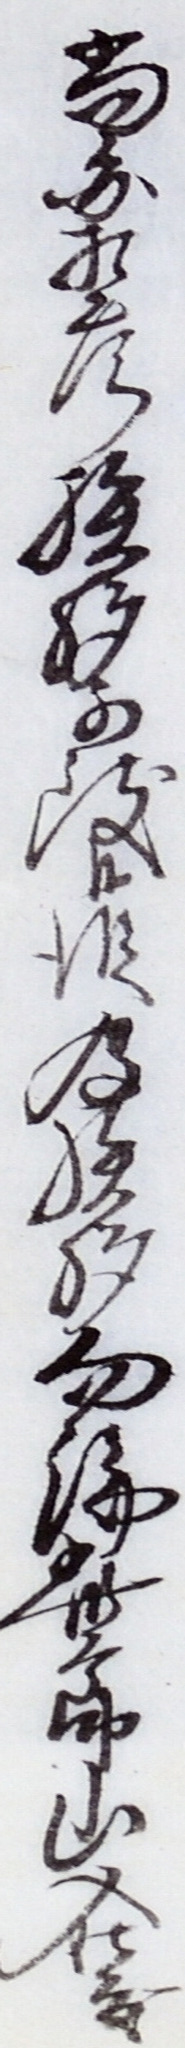尚亦相考差挨拶可致候段及挨拶勿論此節山入仕度
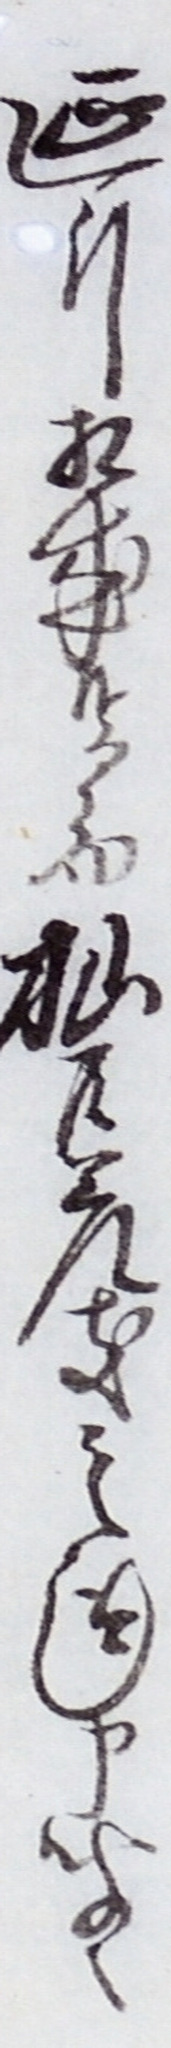延引相成候而は杣共差支之趣申聞候
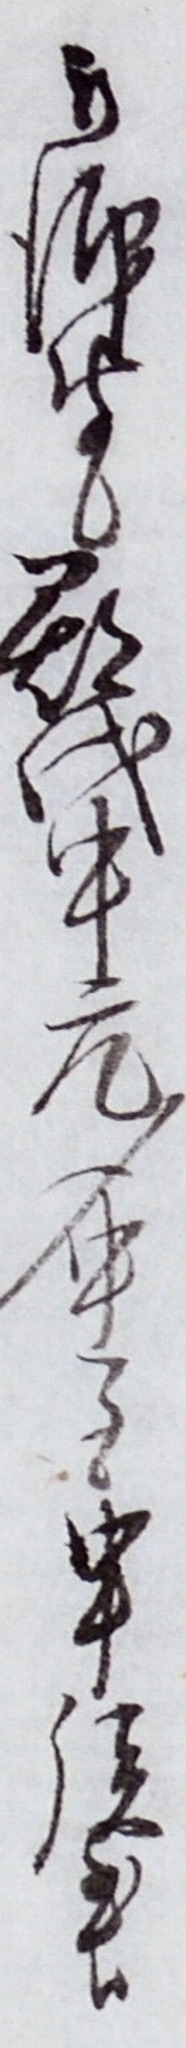被仰付候郡代中元〆中ニも申談置候
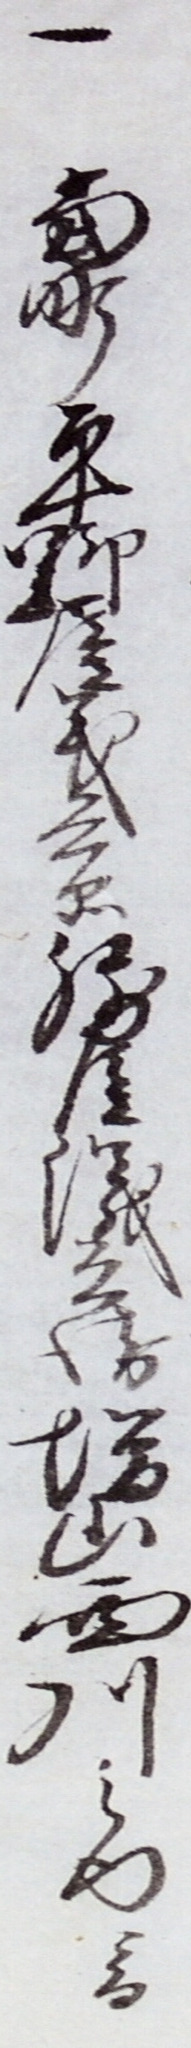一当町平野屋義兵衛綿屋儀兵衛増山西川之内ニ而
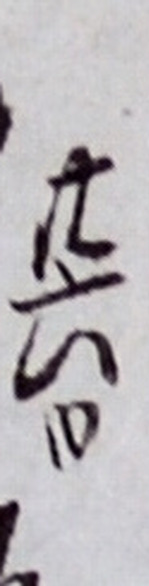廿六日
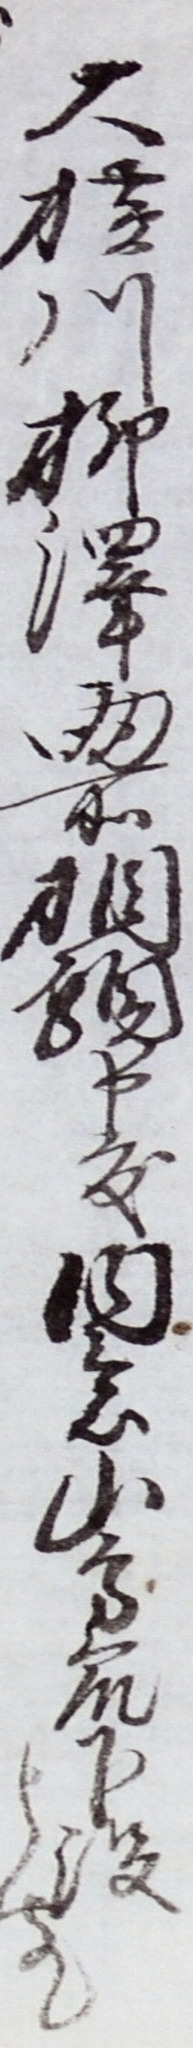大横川柳澤両所相願申度内意山方衆下役申聞候
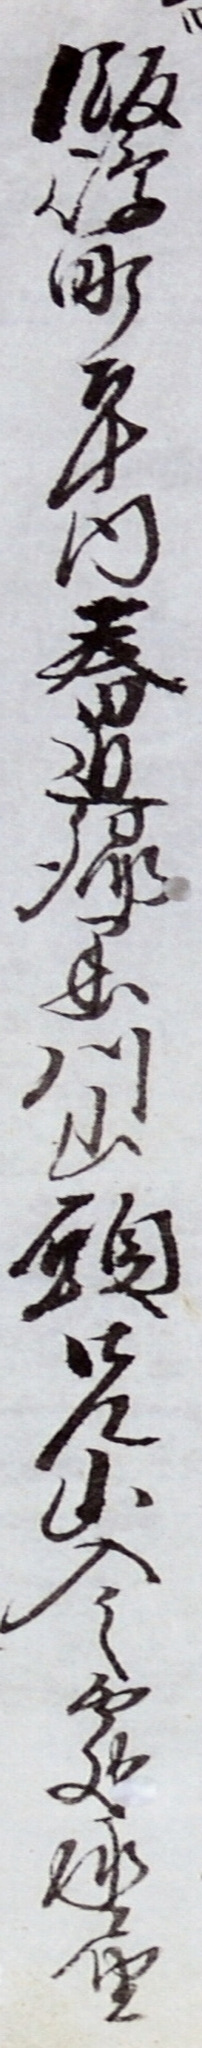一飯嶋町平内春近郷黒川山願先山入之処承届
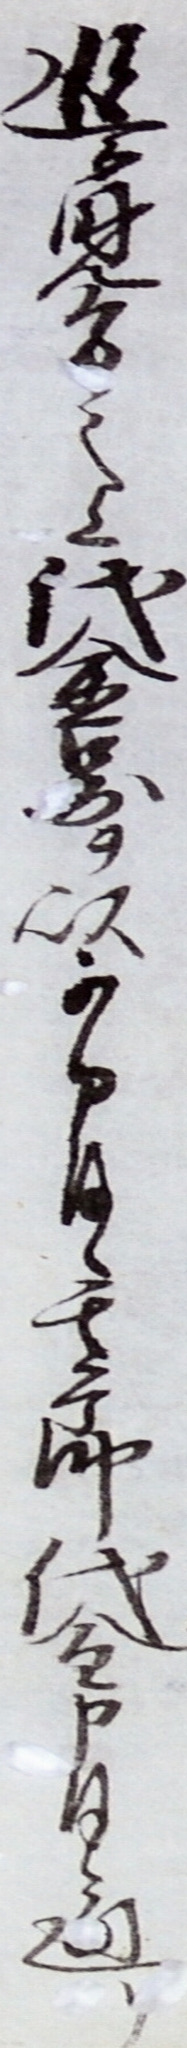追而見分之上代金図ヲ以可申付候其節代金申付之通り
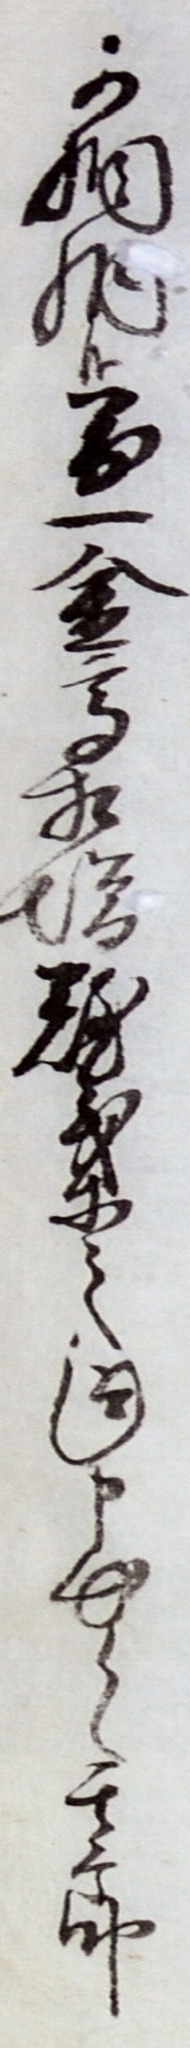可相納候万一金高相増難義等之趣申出候其節

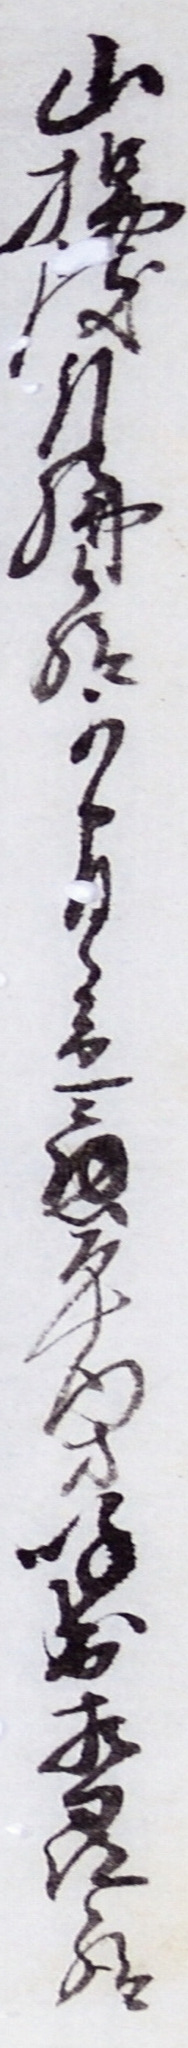山揚致引払候様可申付旨一応平内方呼出相尋候様
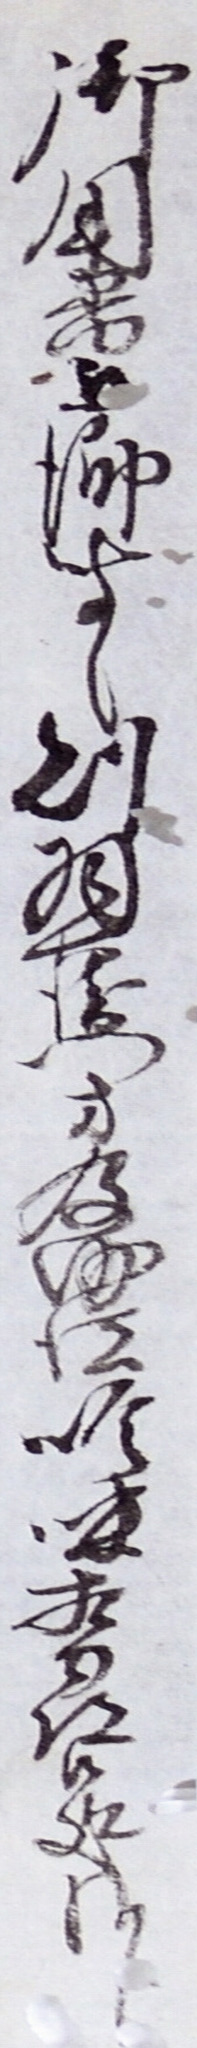御用番被仰聞候則羽右衛門方及沙汰吟味相尋候処何も
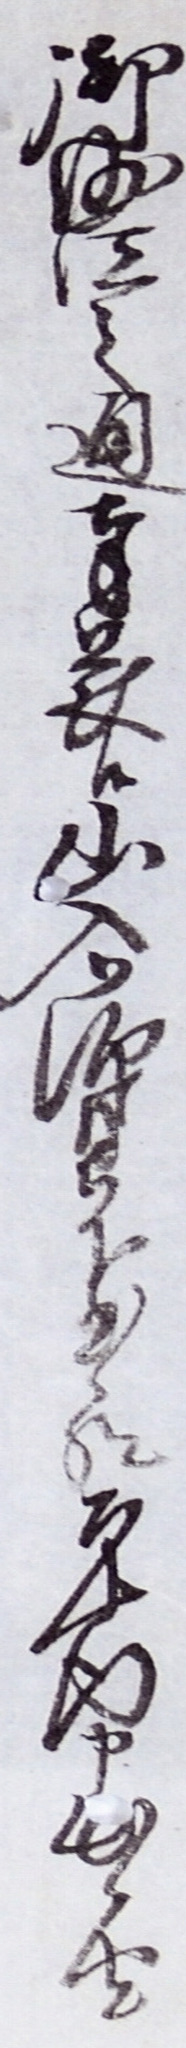御沙汰之通奉畏候山入被仰付被下置候様平内申出候由
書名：御山奉行御用控
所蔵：伊那市立高遠町図書館・合同会社AMANE
